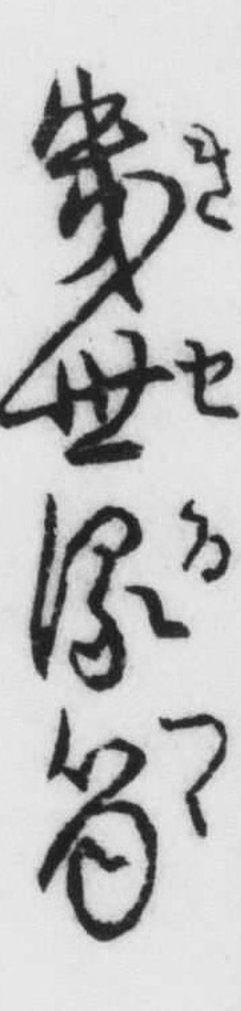幾世流筒
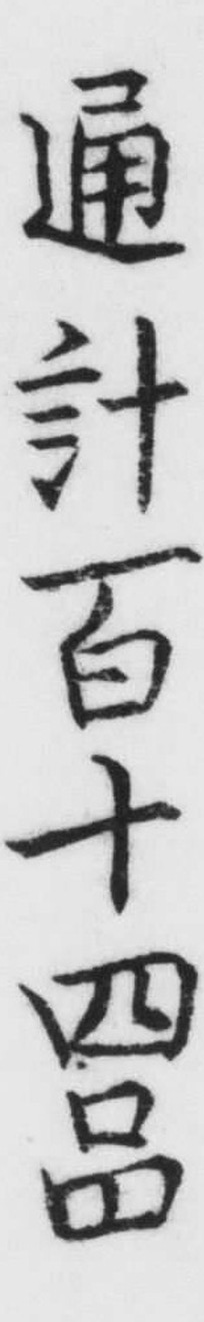通計百十四品
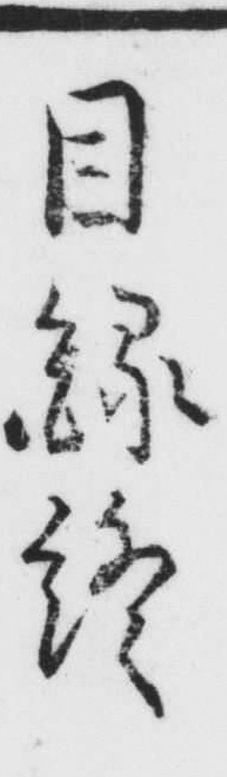目録終
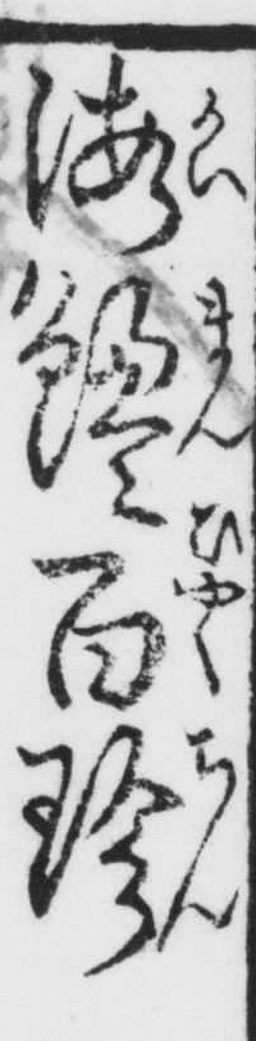海鱧百珍
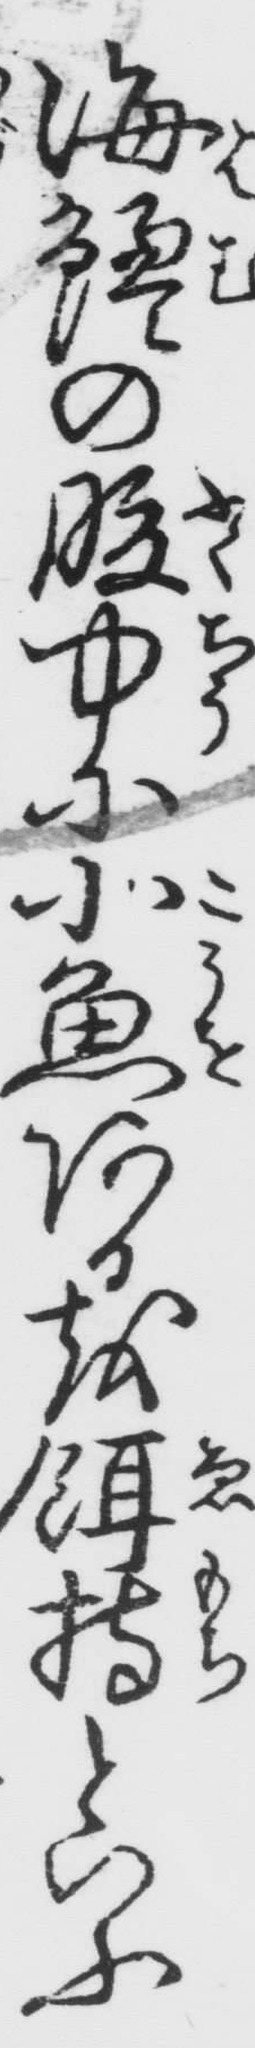海鱧の腹中に小魚あるを餌持といふ
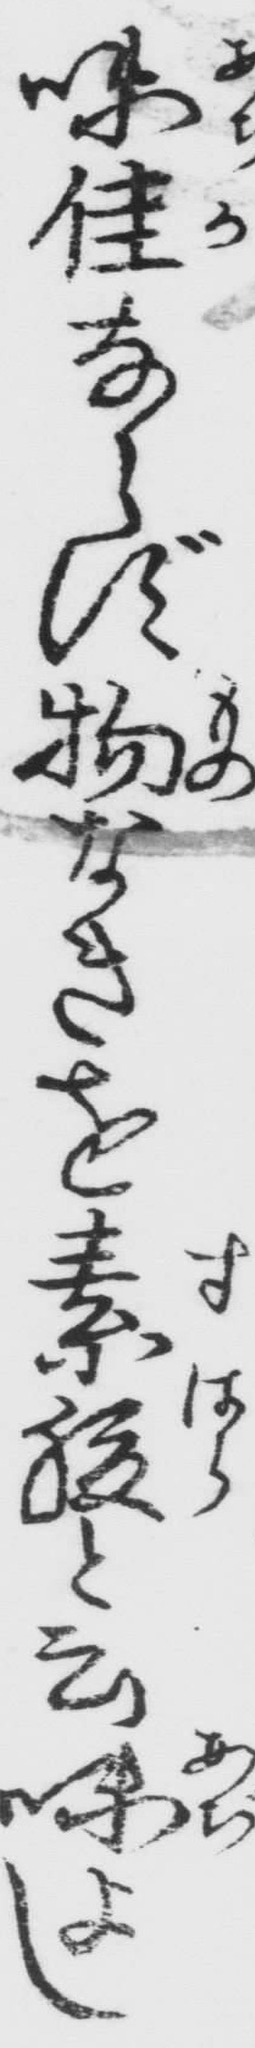味佳ならず物なきを素腹と云味よし
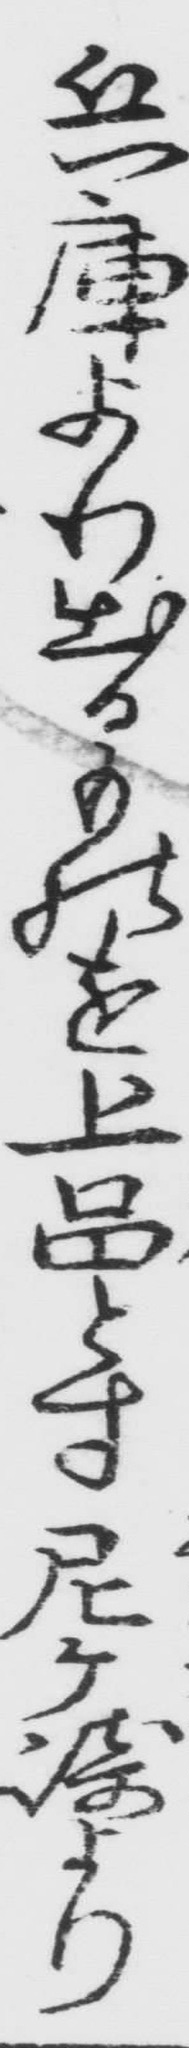兵庫より出るものを上品とす尼ヶ崎より
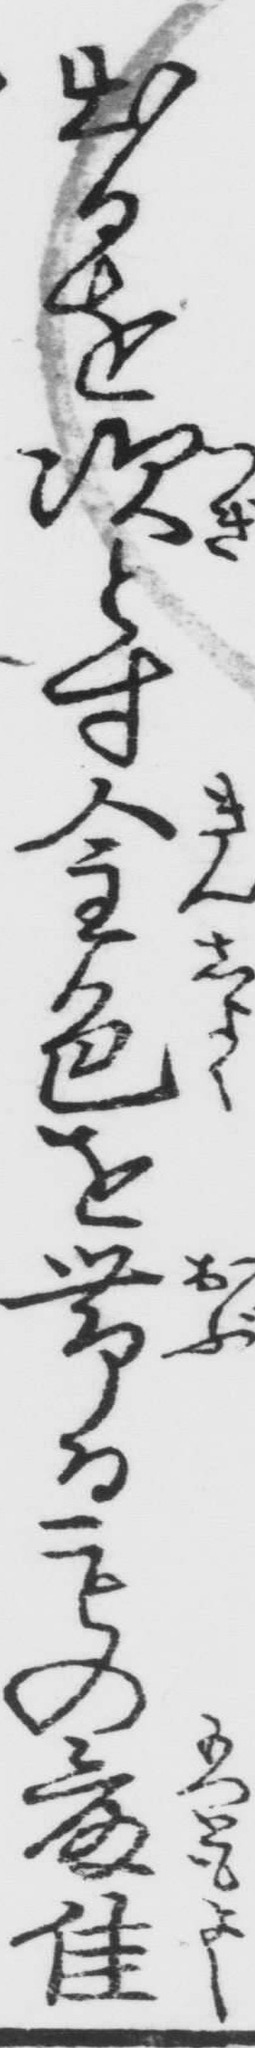出るを次とす金色を帯るもの最佳
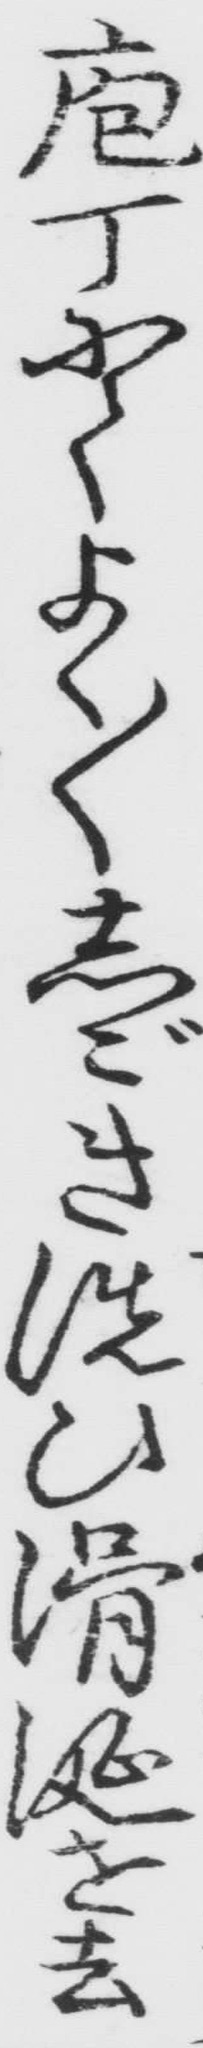庖丁にてよく〳〵しごき洗ひ滑涎を去
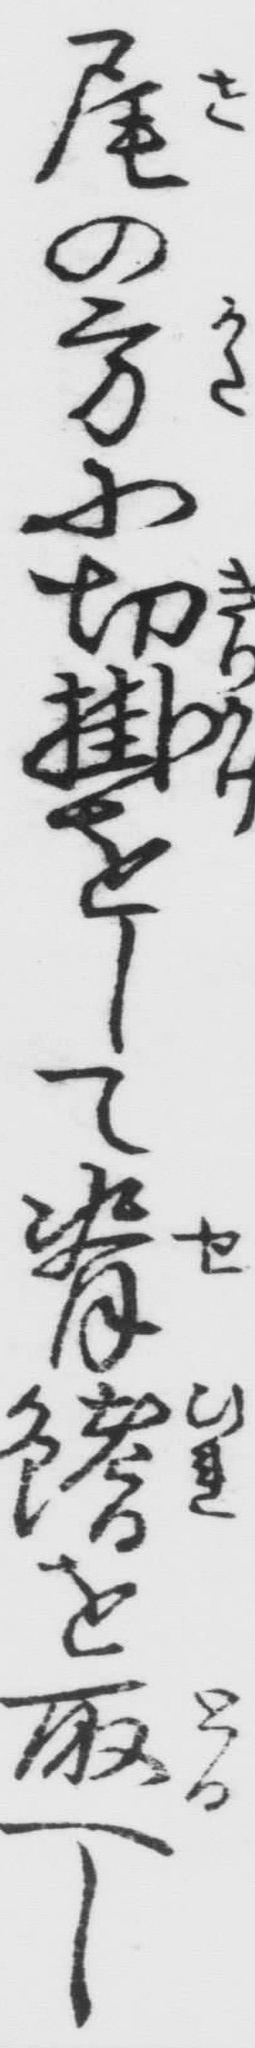尾の方に切掛をして背鰭を取へし

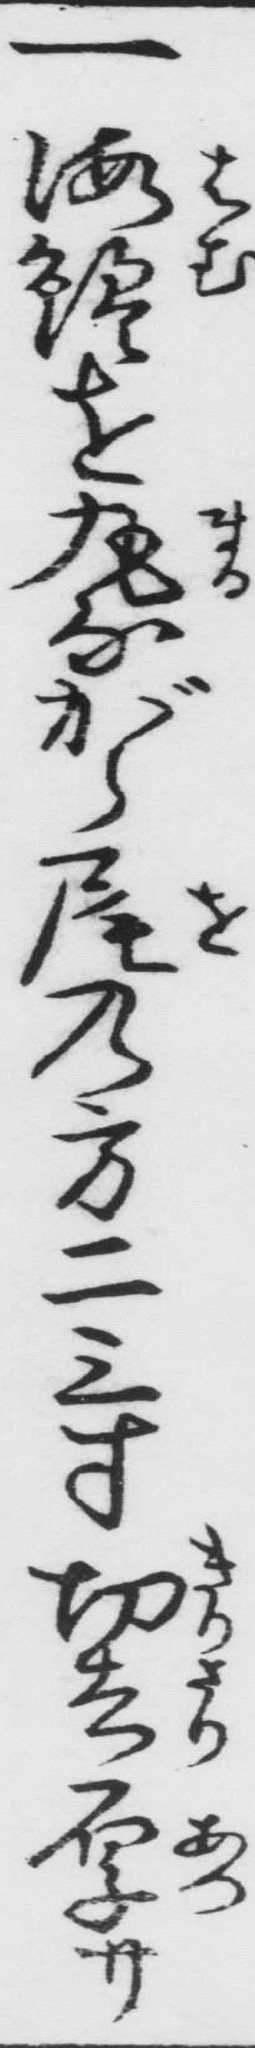一海鱧を丸ながら尾の方二三寸切去り厚さ
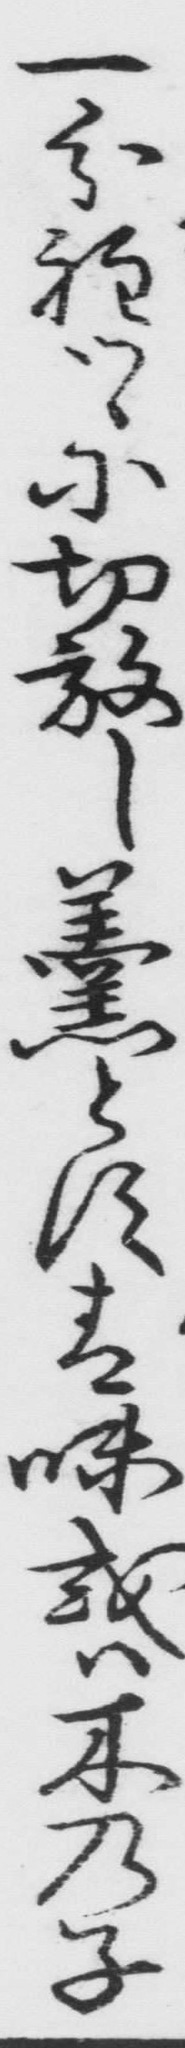一分程つゝに切放し羹とす青味或は木の子
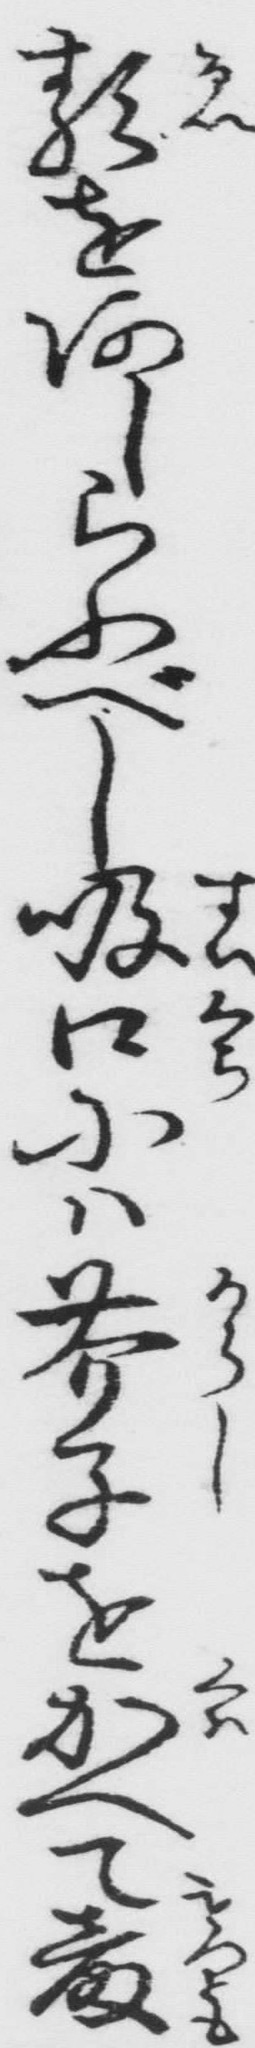類をあしらふべし吸口には芥子を加へて最
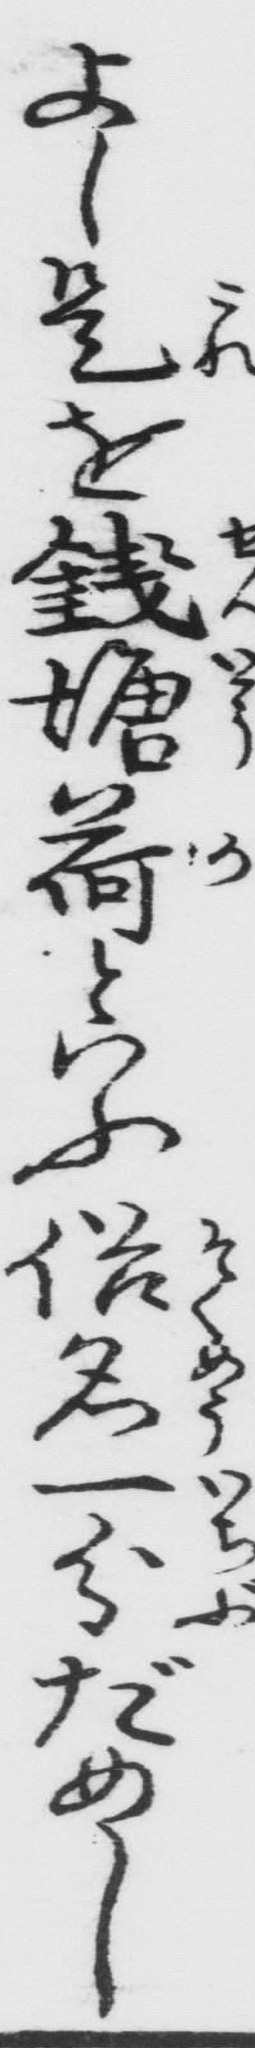よし是を銭塘荷といふ俗名一分だめし
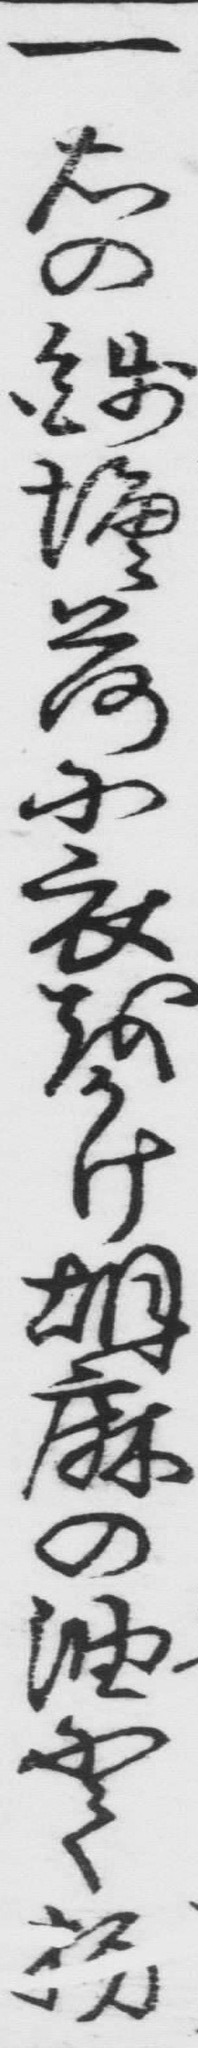一右の銭塘荷に衣をかけ胡麻の油にて揚
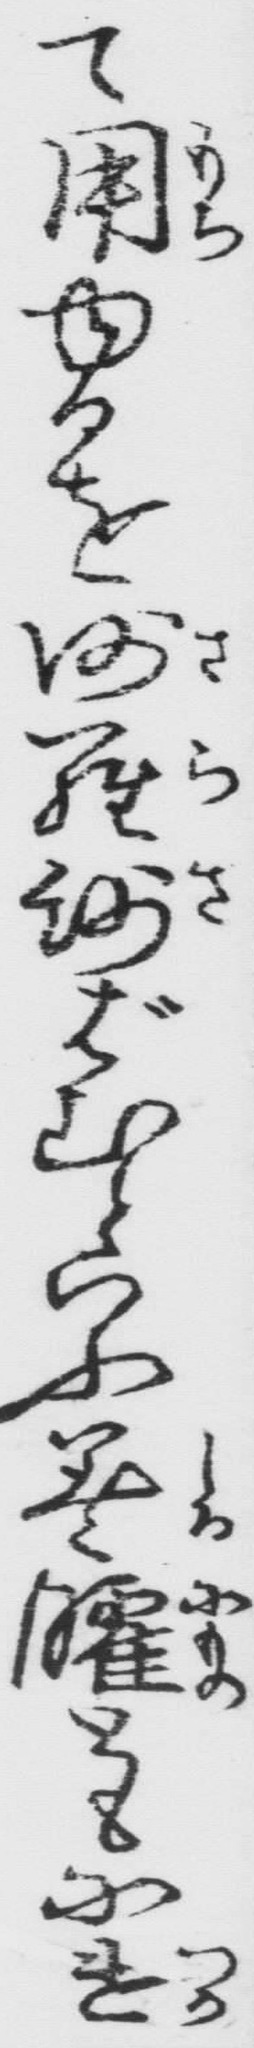て用ゆるを沙羅紗ばむといふ羹臛ともに遣
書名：海鰻百珍
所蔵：大阪府立大学学術情報センター 国文学研究資料館
